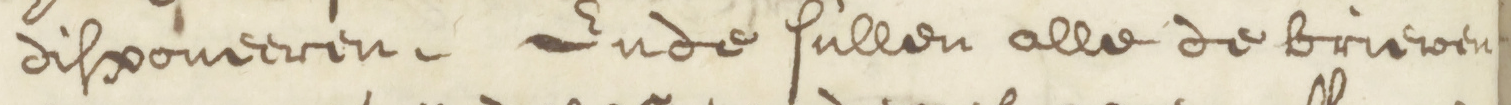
disponeeren. Ende sullen alle de brieven
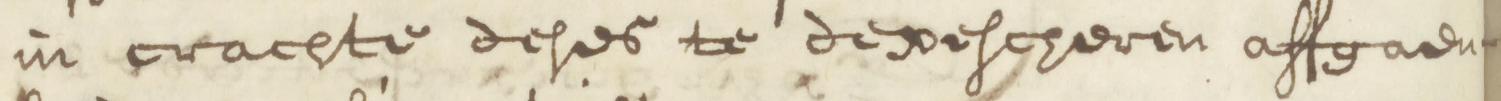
in crachte deses te depescheren affgaen
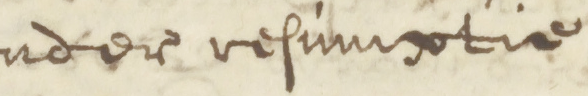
sonder resumptie.
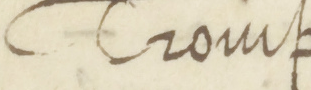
Tromp
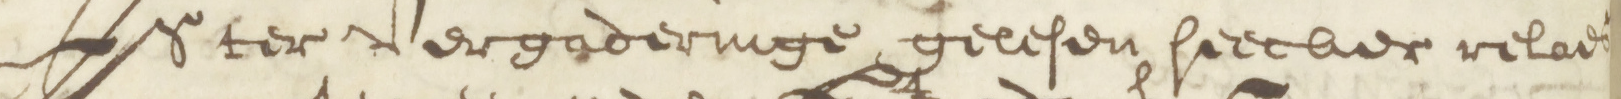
Is ter Vergaderinge gelesen seecker relaes
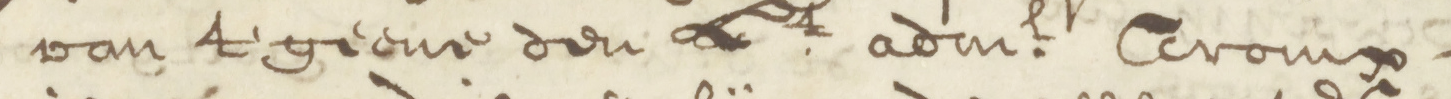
van t‛ geene den Lt. adml. Tromp
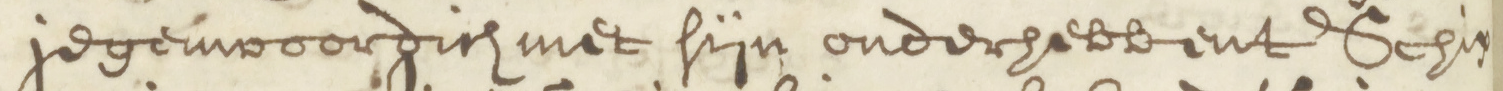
jegenwoordich met sijn onderhebbent Schip
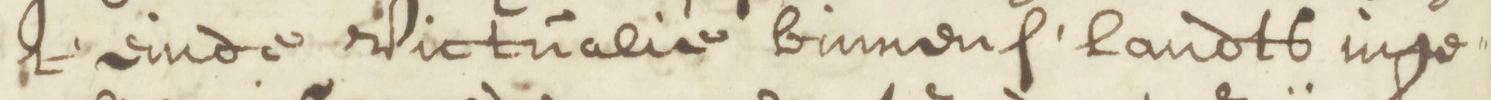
t‛einde Victualie binnen s‛Landts inge„
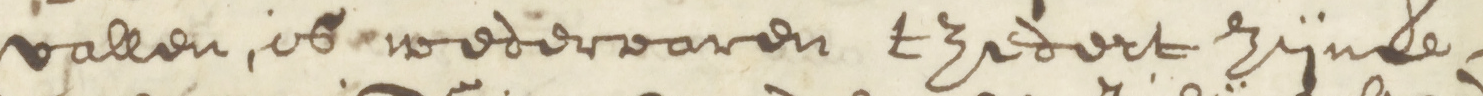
vallen, is wedervaren tzedert zijne
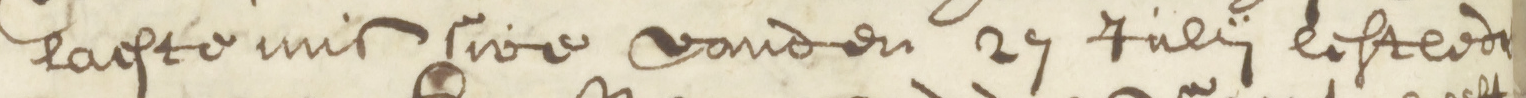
laeste missive vanden 27 Julij lestlede
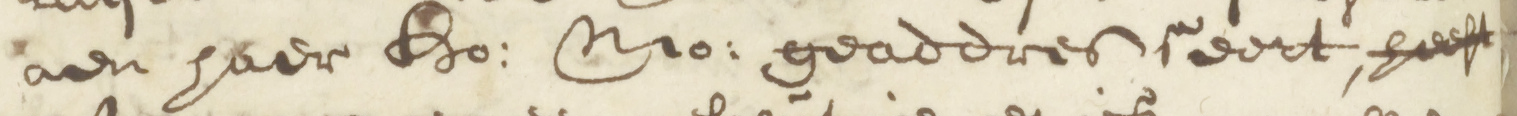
aen haer Ho:Mo: geaddresseert, heeft
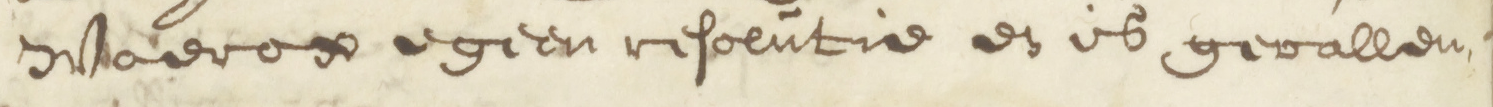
Waerop egeen resolutie en is gevallen.
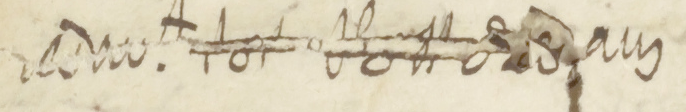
admt. tot Rotterdam
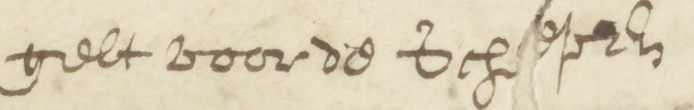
gelt voor de Schepen
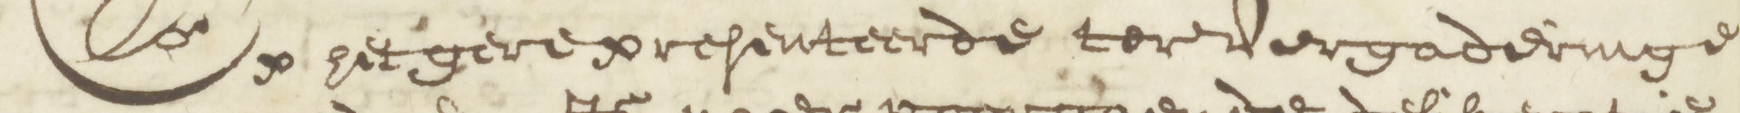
Op het gerepresenteerde ter Vergaderinge
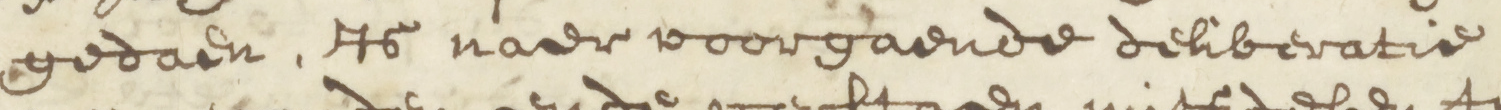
gedaen, Is naer voorgaende deliberatie
